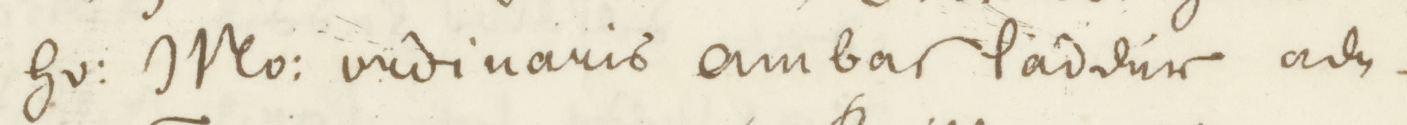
ho:Mo: ordinaris Ambassadeur aen
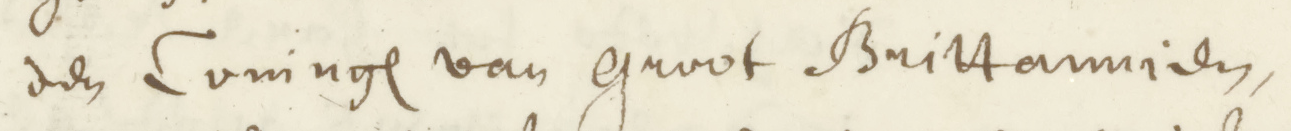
den Coningh van Groot Brittannien,
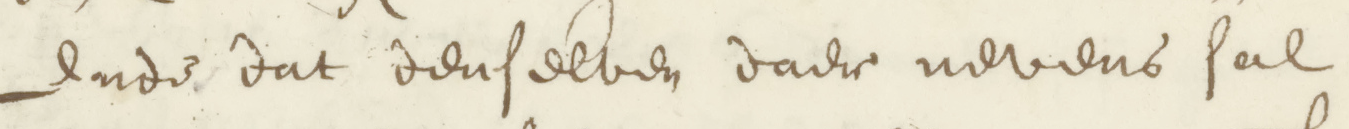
Ende dat denselven daer nevens sal
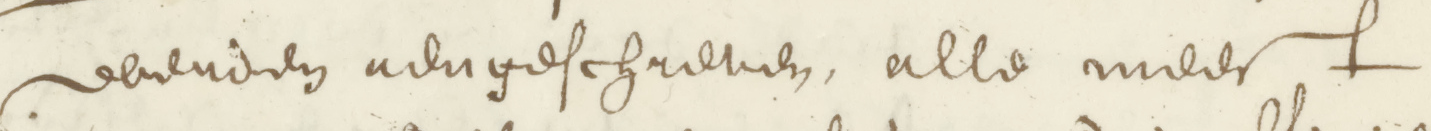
werden aengeschreven, alle meest
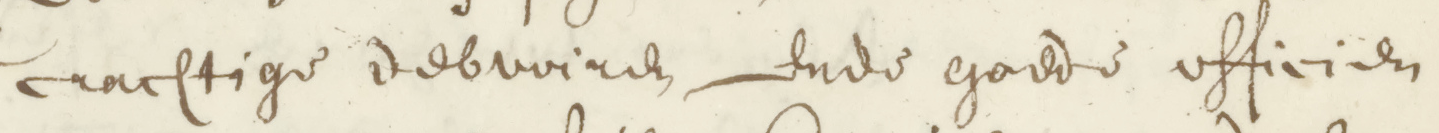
crachtige debvoiren ende goede officien
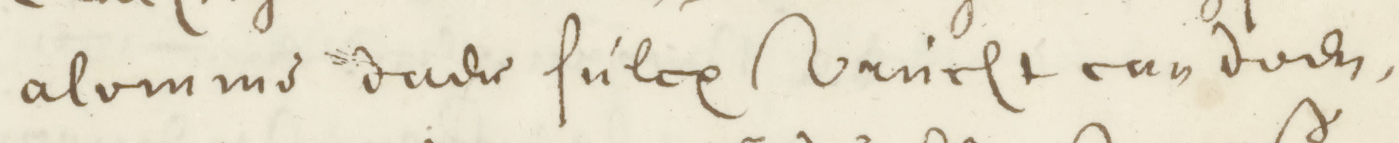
alomme daer sulcx vrucht can doen,
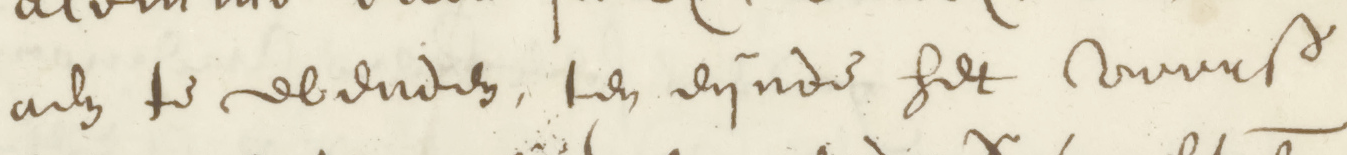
aen te wenden, ten eijnde het voors
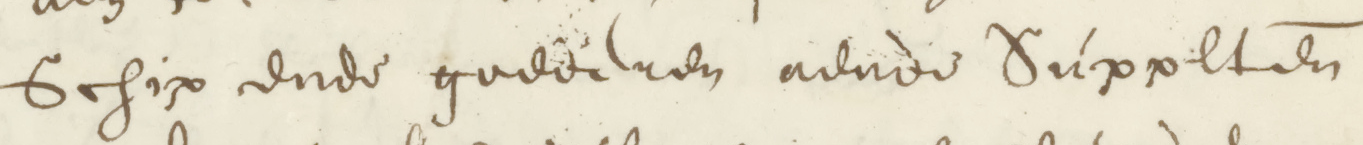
Schip ende goederen aende Supplten
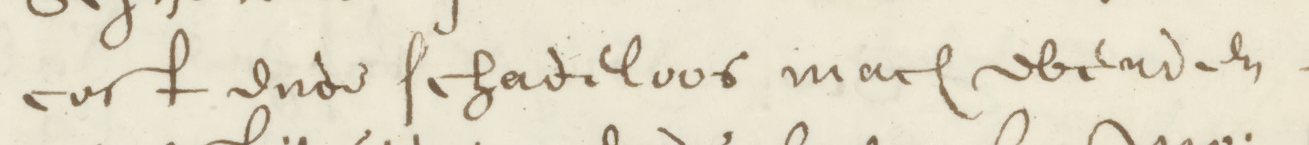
cost ende schadeloos mach werden
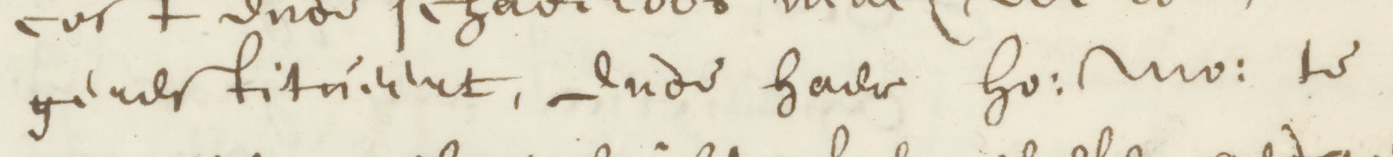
gerestitueert, ende haer ho:Mo: te
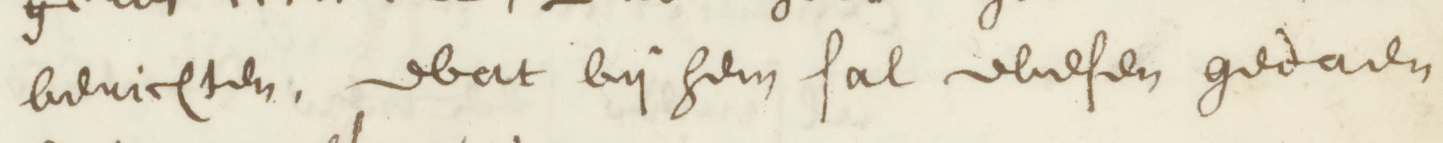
berichten, wat bij hem sal wesen gedaen
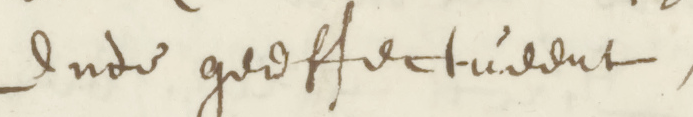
Ende geeffectueert.
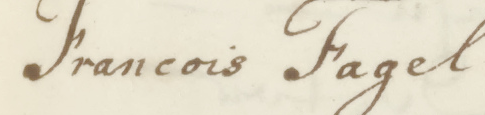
Francois Fagel
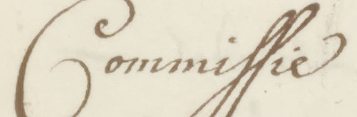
Commissie
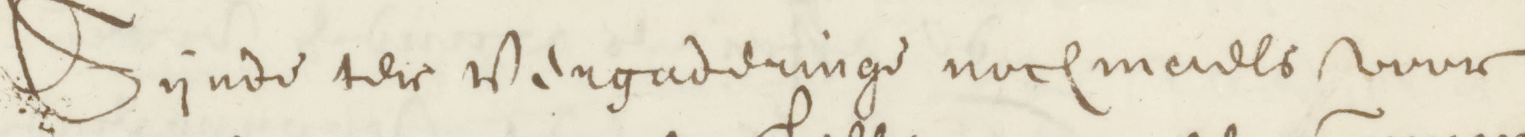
Sijnde ter Vergaderinge nochmaels voor
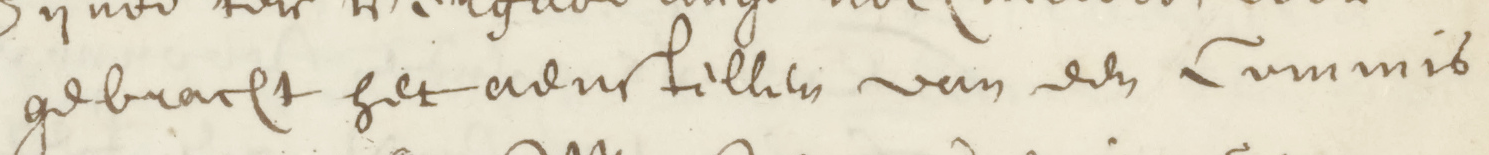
gebracht het aenstellen van een Commis
